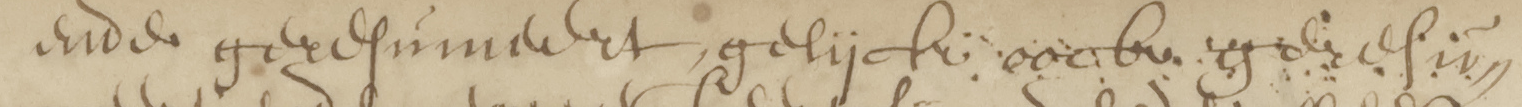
ende geresumeert, gelijck, oock geresu„
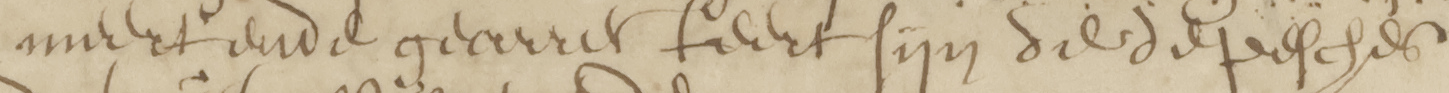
meert ende gearresteert sijn de depesches
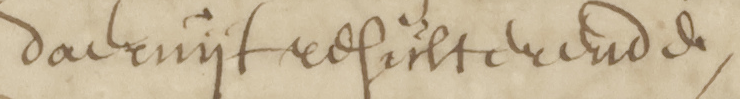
daeruijt resulterende.
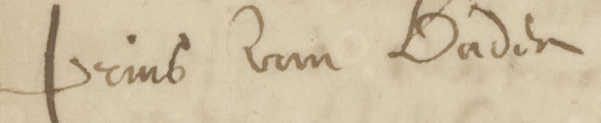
Prins van Baden
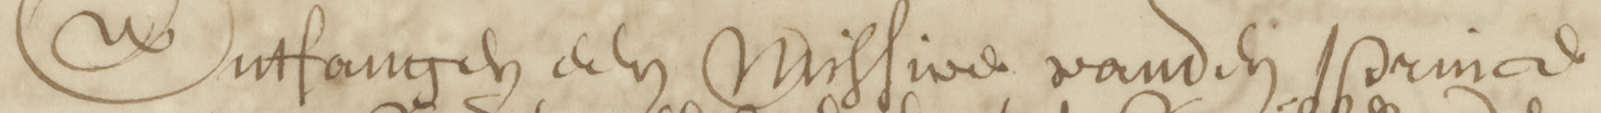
Ontfangen een missive vanden Prince
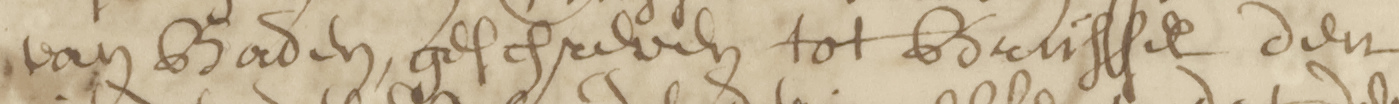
van Baden, geschreven tot Brusssel den
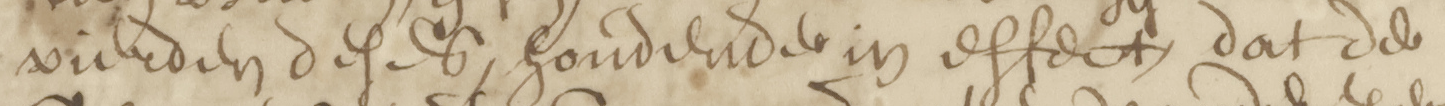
vierden deses, houdende in effect, dat de
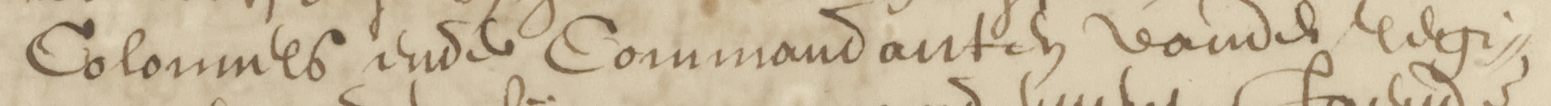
Colonnels ende Commandanten vande regi„
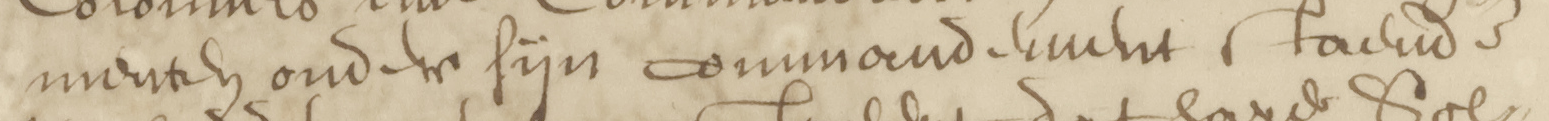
menten onder sijn commandement staende
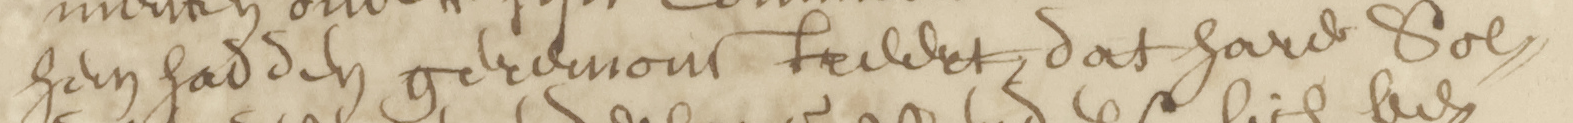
hem hadden geremonstreert, dat hare Sol,,
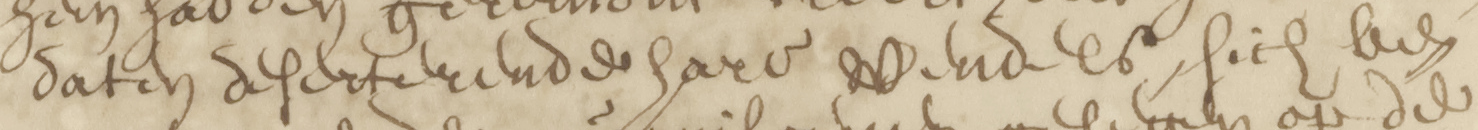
daten deserterende hare vendels, sich be,,
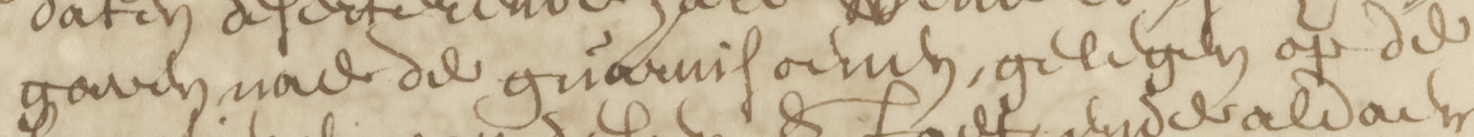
gaven nae de guarnisoenen, gelegen op de
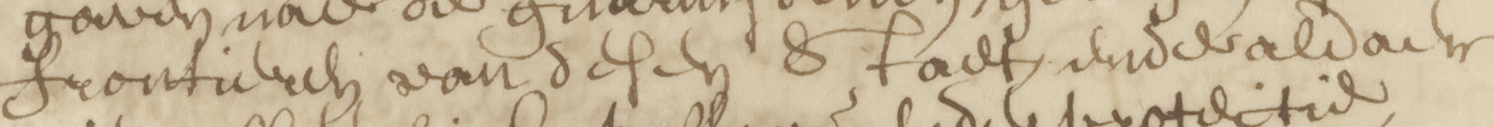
frontieren van desen staet, ende aldaer
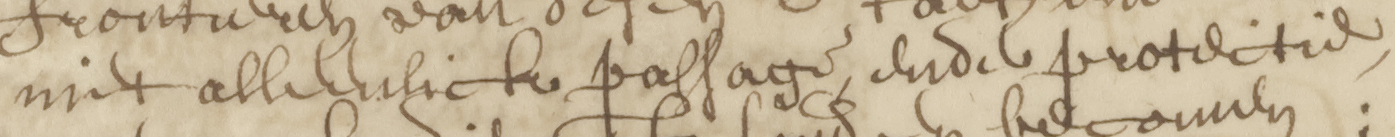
niet alleenlick passage ende protectie,
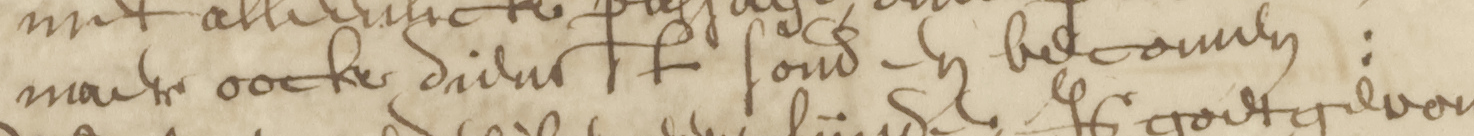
maer oock dienst souden becomen:
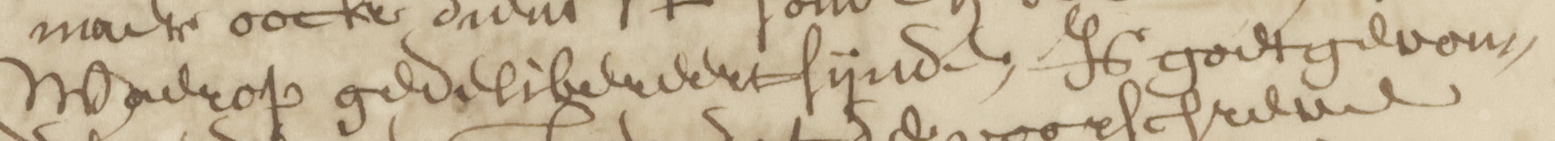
Waerop gedelibereert sijnde, Is goetgevon„
